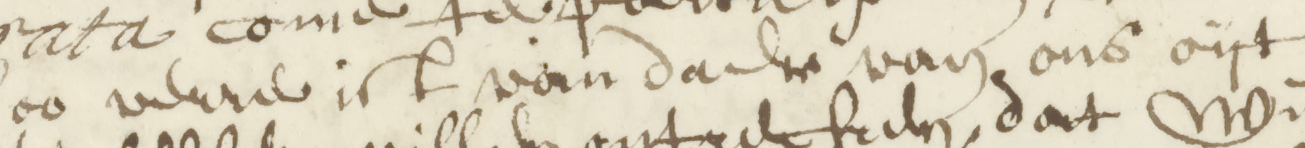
soo verre ist van daer van ons oijt
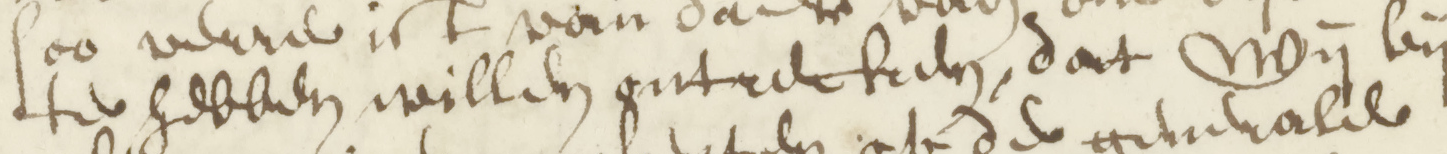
te hebben willen ontrecken, dat Wij bij
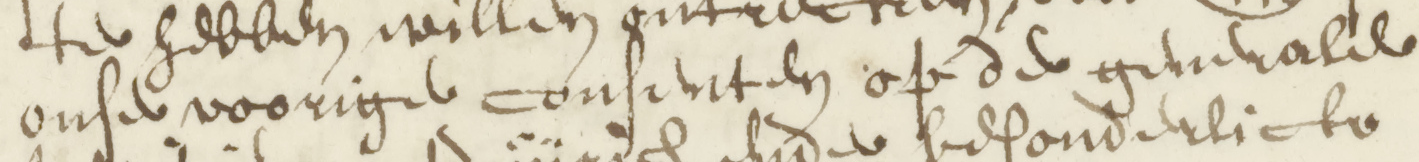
onse voorige consenten op de generale
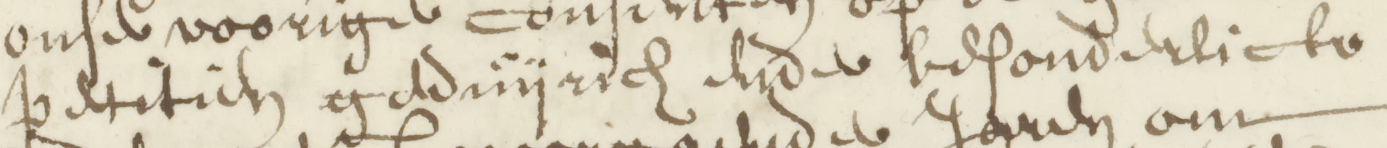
petitien geduijrich ende besonderlick
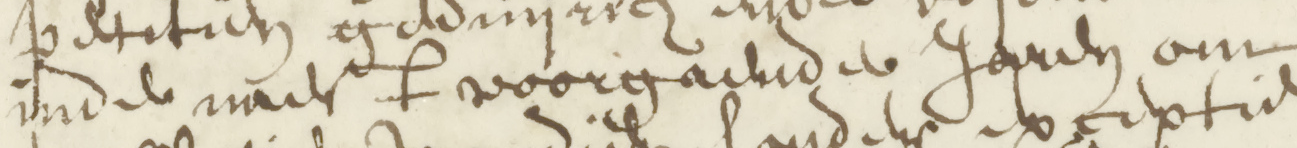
inde naest voorgaende Jaren om
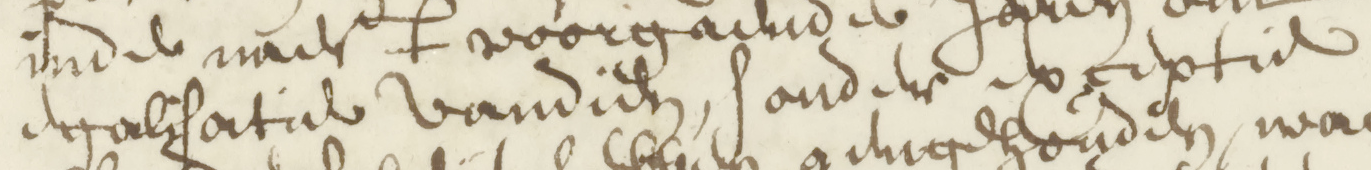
egalisatie vandien, sonder exceptie
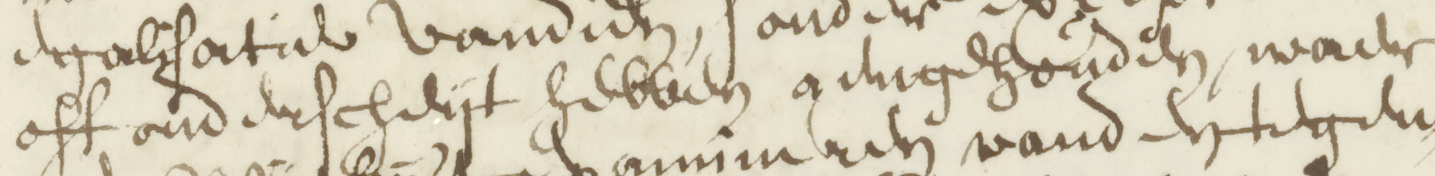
off onderscheijt hebben aengehouden, waer
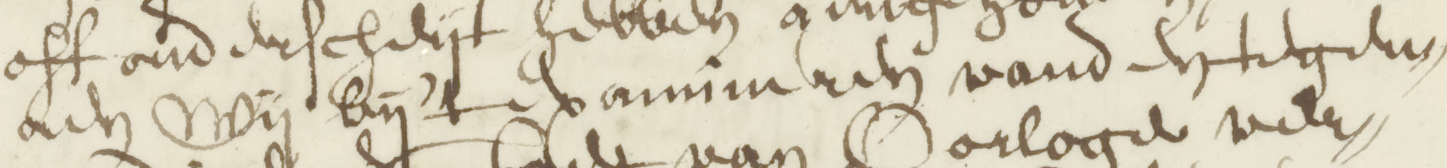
aen Wij bij 't examineren vanden tegen„
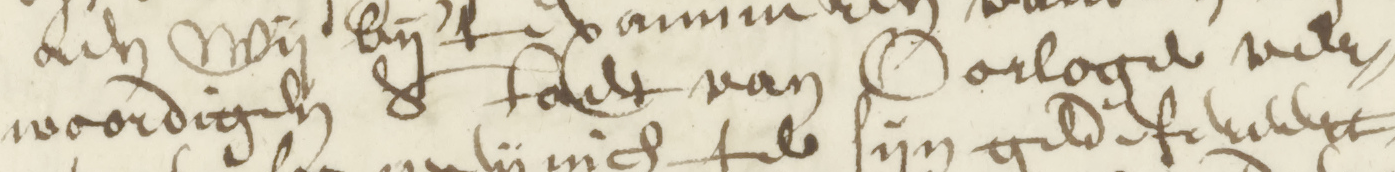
woordigen Staet van Oorloge ver„
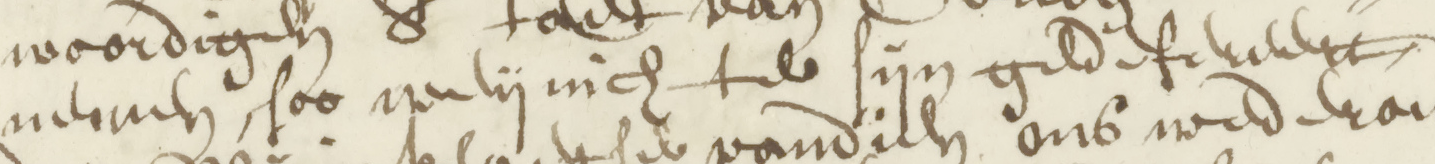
nemen, soo weijnich te sijn gedefereert,
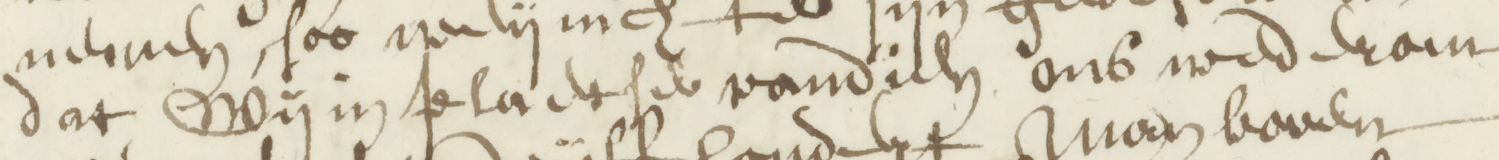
dat Wij in plaetse vandien ons wederom
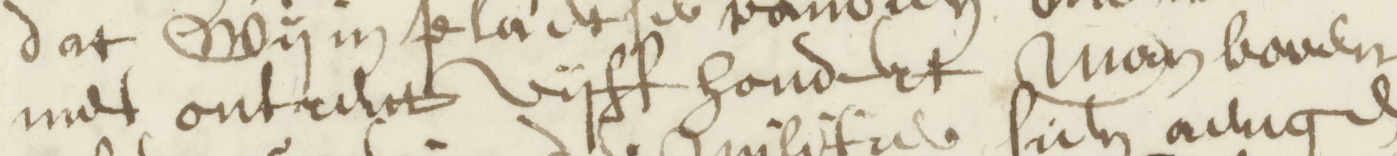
met ontrent vijff hondert Man boven
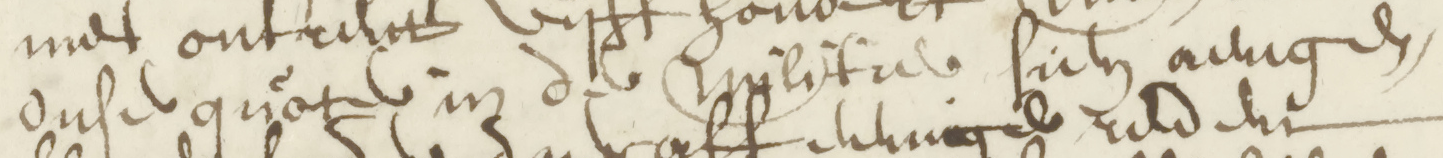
onse quote in de Militie sien aenge„
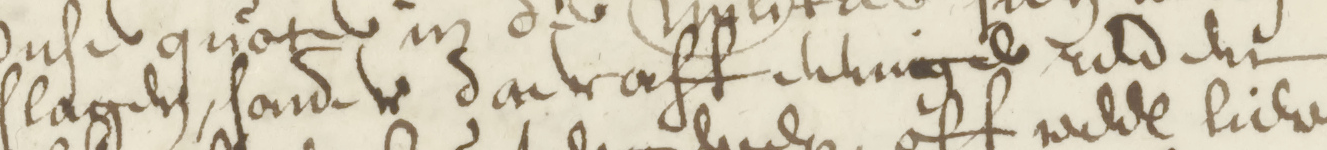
slagen, sonder daeraff eenige reden
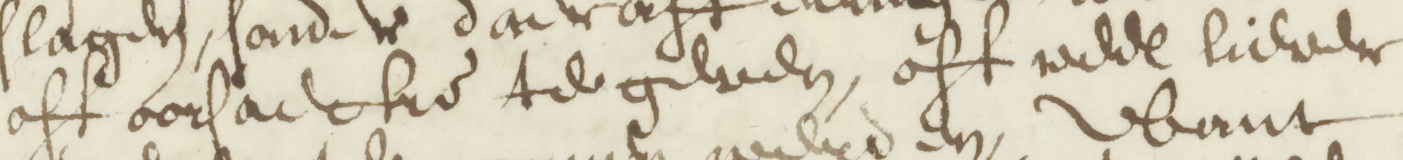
off oorsaecke te geven, off veel liever
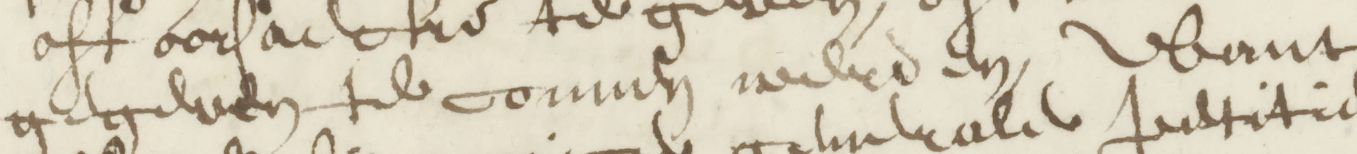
gegeven te connen werden, want
